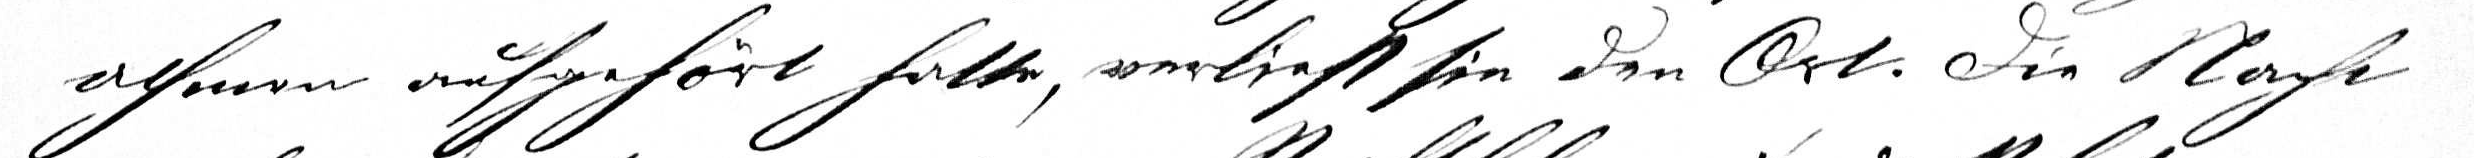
athmen aufgehört hatte, verließ sie den Ort. Die Nacht
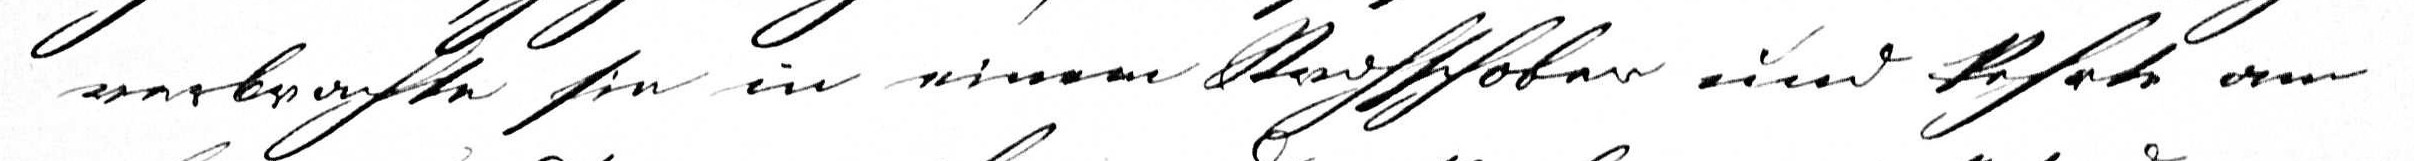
verbrachte sie in einem Strohschober und kehrte am
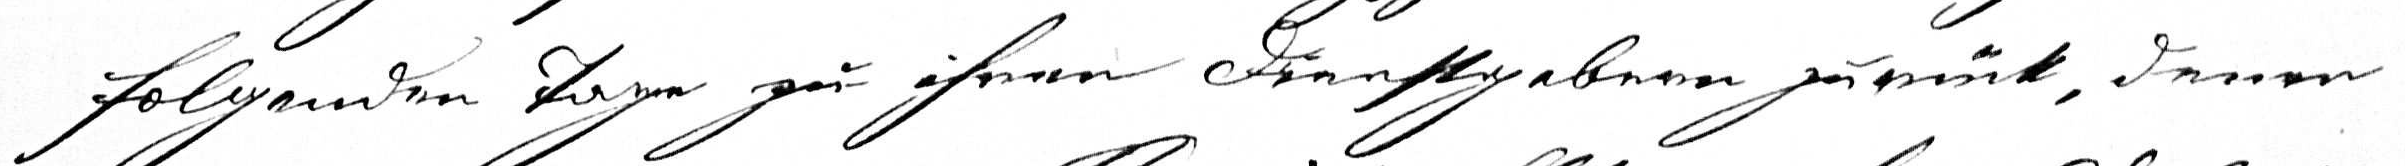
folgenden Tage zu ihren Dienstgebern zurück, denen
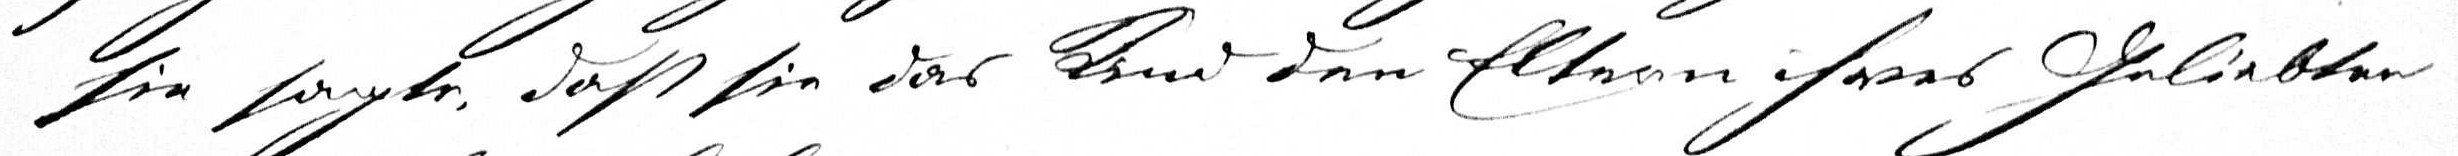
sie sagte, daß sie das Kind den Eltern ihres Geliebte
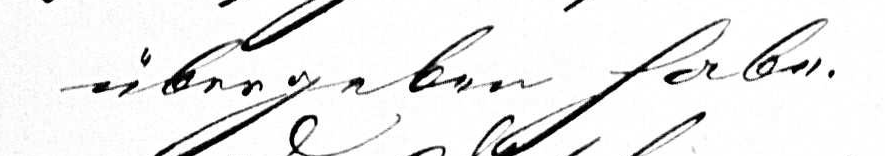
übergeben habe.
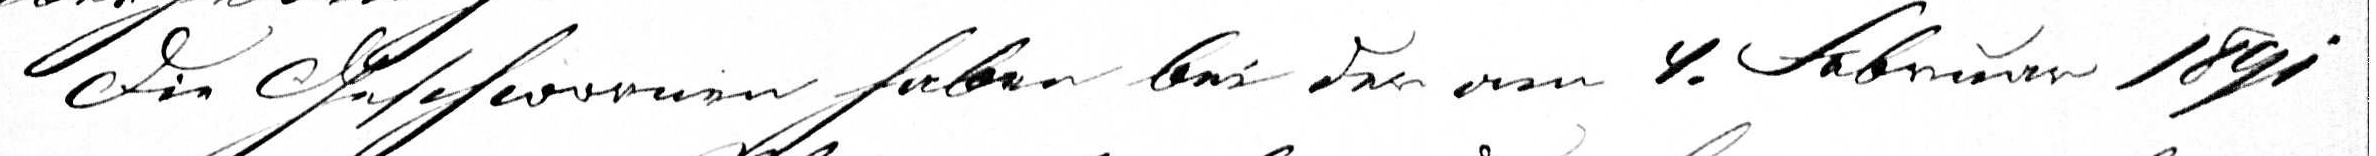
Die Geschworenen haben bei der am 4. Februar 1891
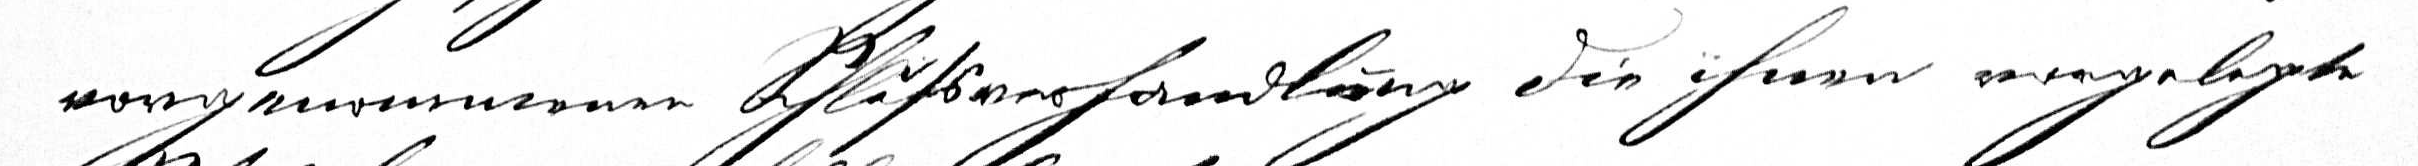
vorgenommenen Schlußverhandlung die ihnen vorgelegte
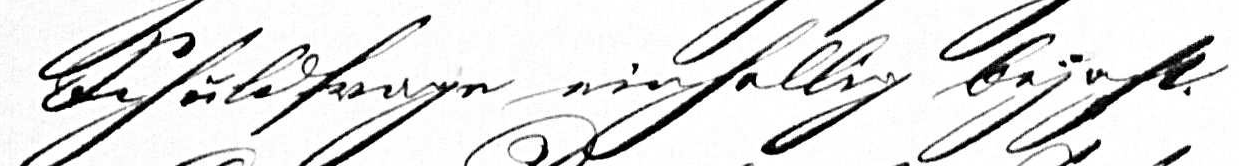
Schuldfrage einhellig bejaht.
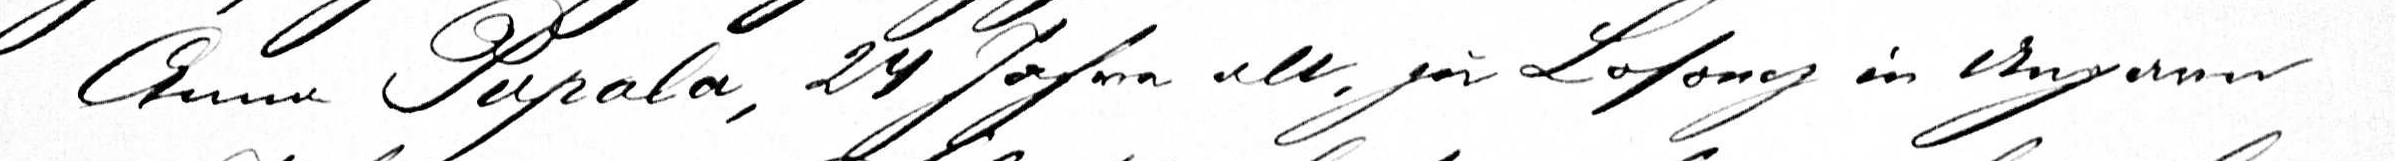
Anna Pupala, 24 Jahre alt, in Losoncz in Ungarn
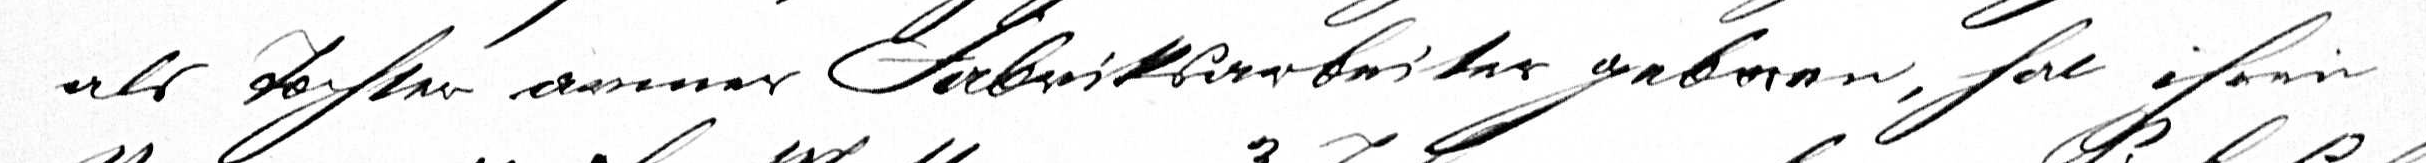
als Tochter armer Fabriksarbeiter geboren, hat ihren
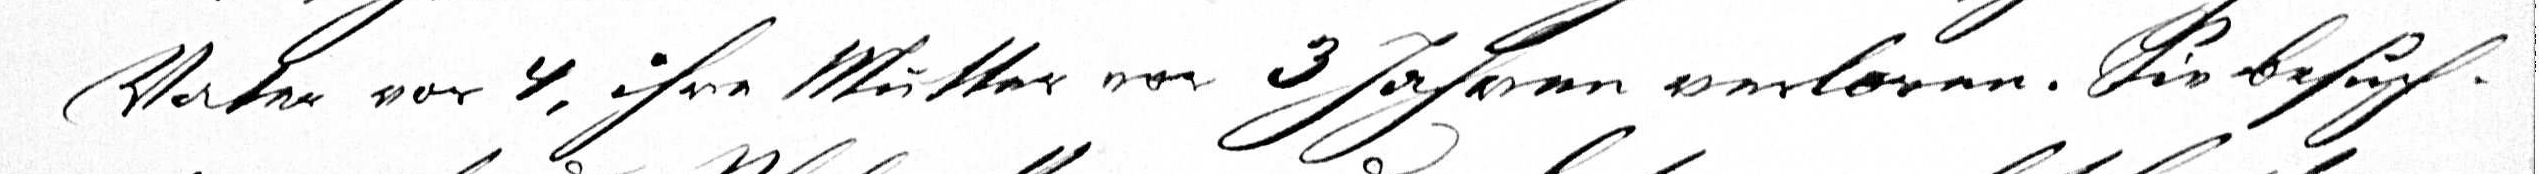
Vater vor 4, ihre Mutter vor 3 Jahren verloren. Sie besuch¬
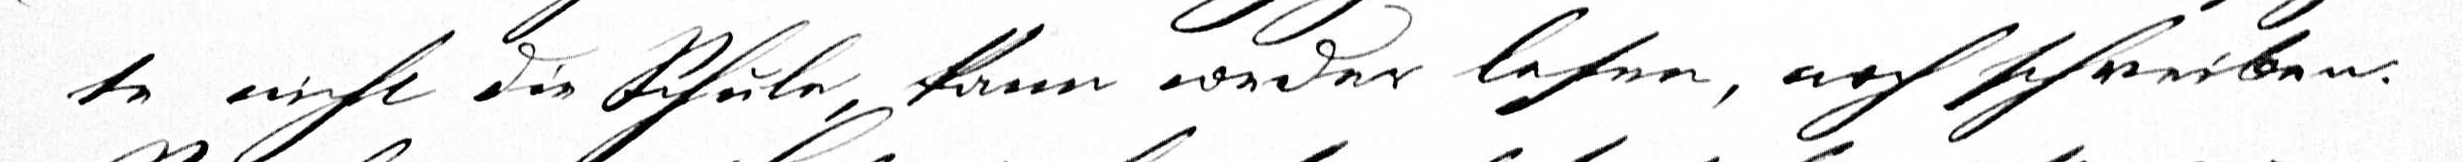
te nicht die Schule, kann weder lesen, noch schreiben.
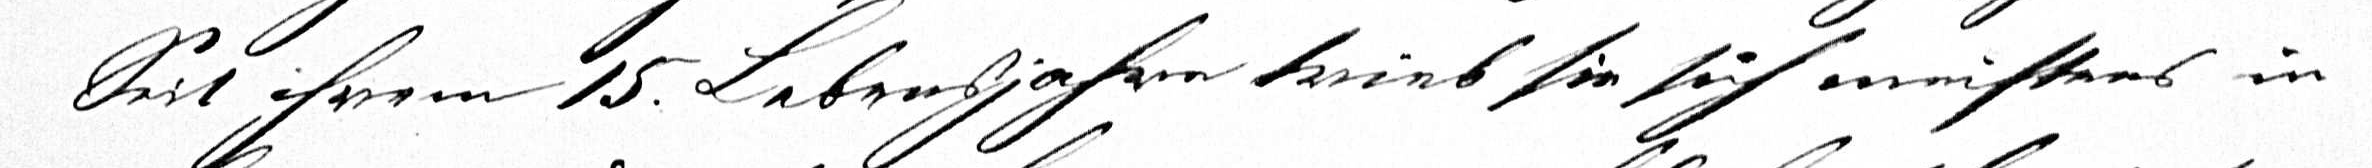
Seit ihrem 15. Lebensjahre trieb sie sich meistens in
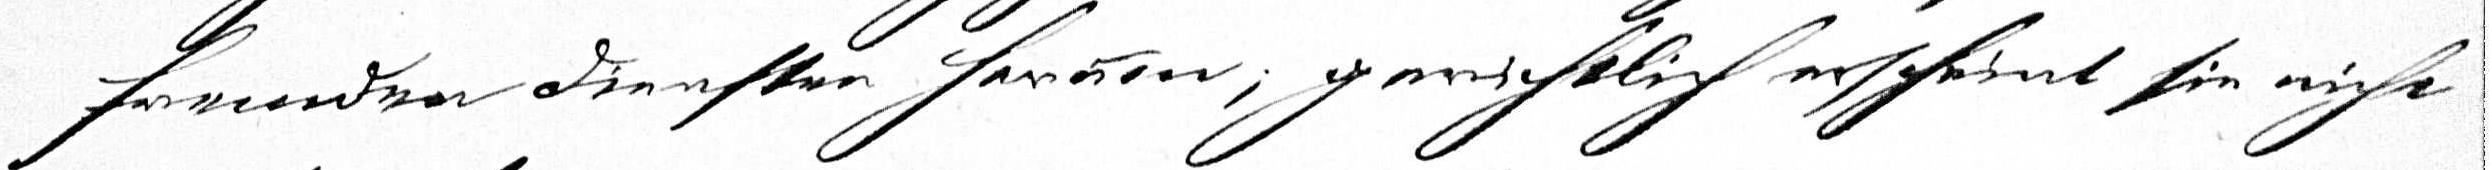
Fremden Diensten herum; gerichtlich erscheint sie nicht
